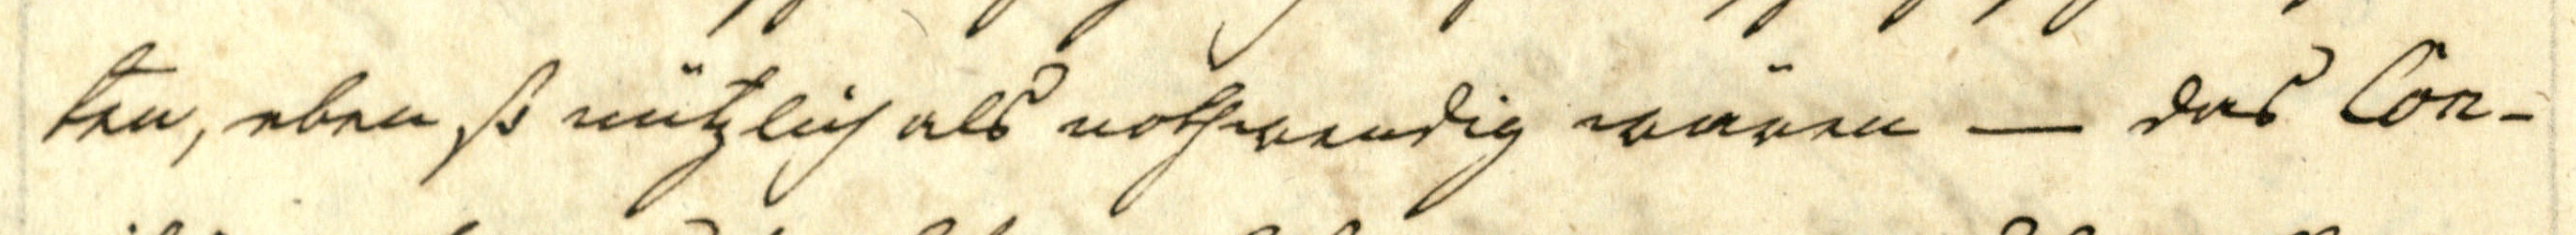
ten, eben so nützlich als nothwendig wären - das Con¬
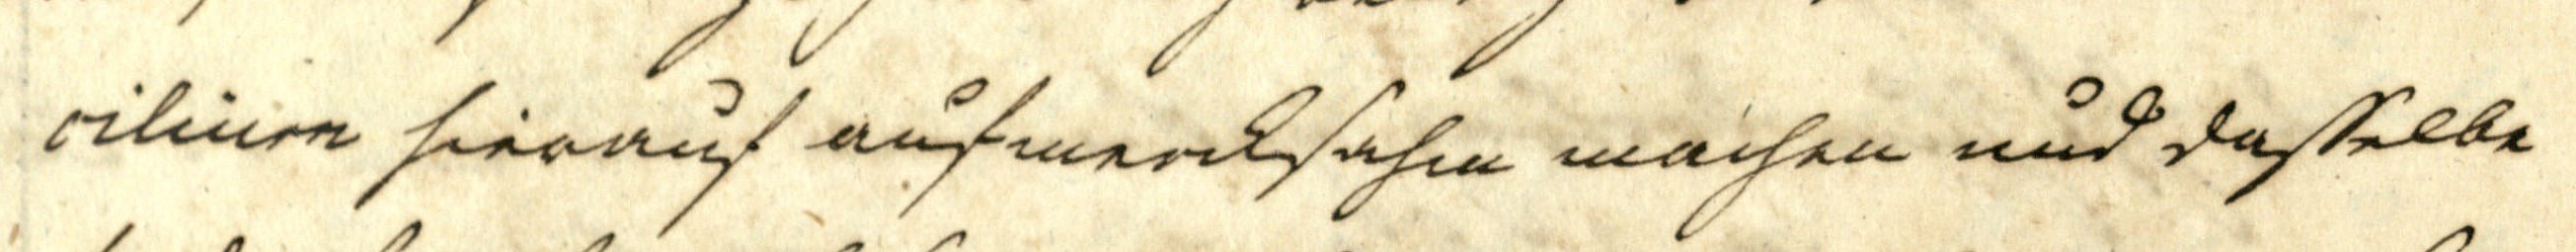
cilium hierauf aufmercksahm machen und dasselbe
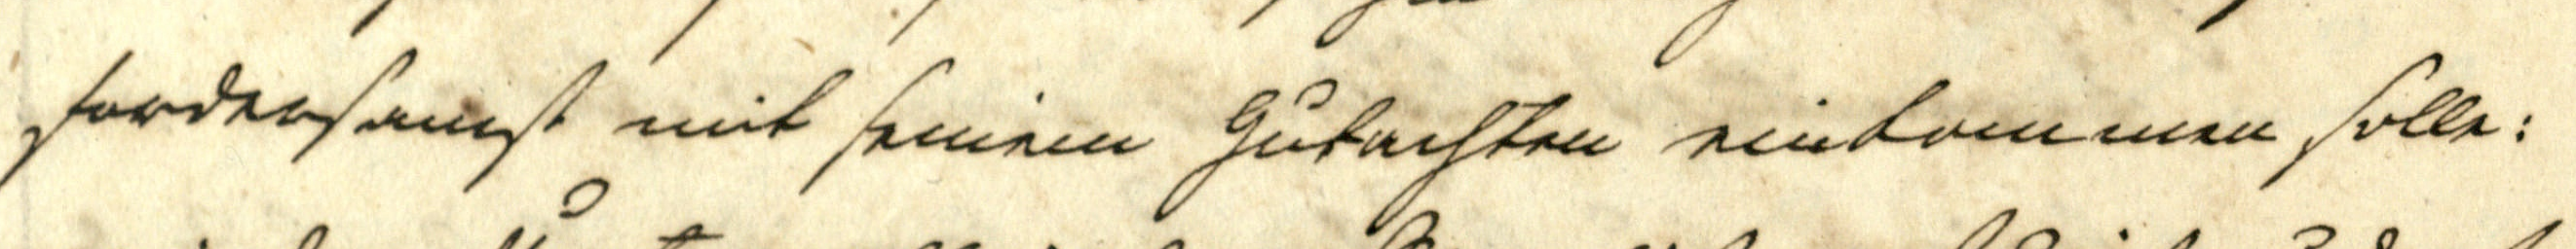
fordersamst mit seinem Gutachten einkommen solle:
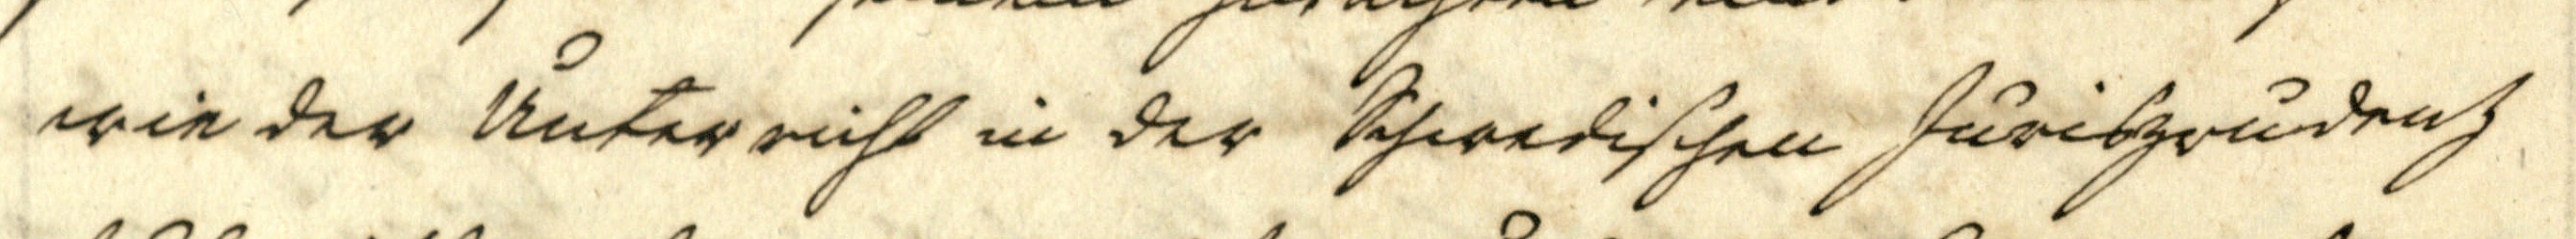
wie der Unterricht in der Schwedischen Jurisprudenz
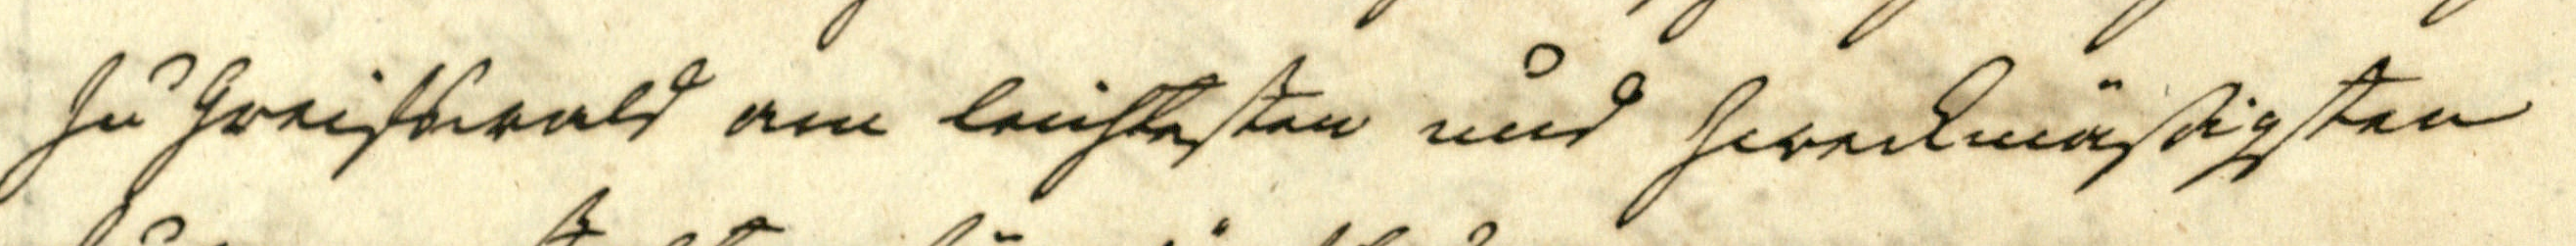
zu Greifswald am leichtesten und zweckmäßigsten
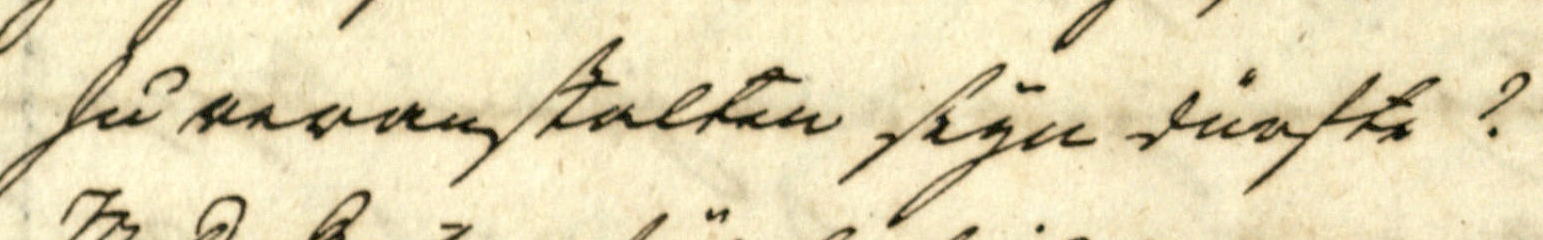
zu veranstalten seÿn dürfte?
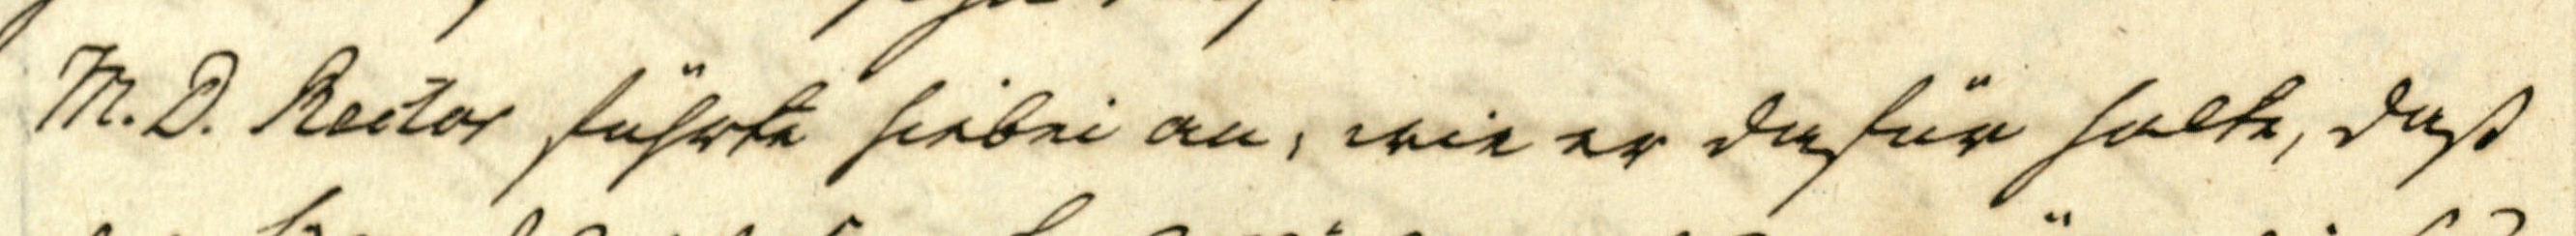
M. D. Rector führte hiebei an: wie er dafür halte, daß
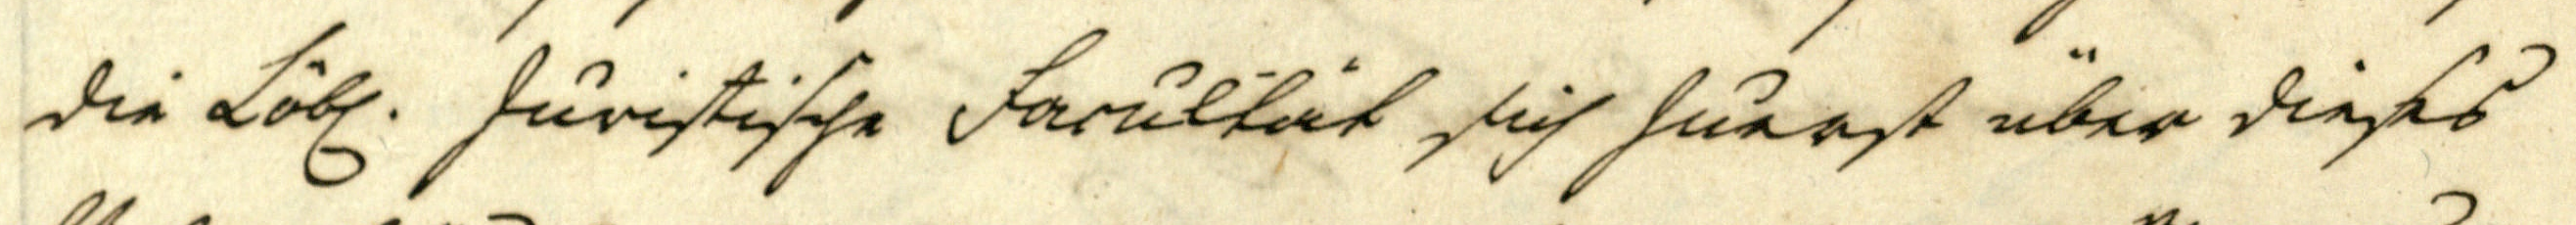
die Löbl. Juristische Facultät sich zuerst über dieses
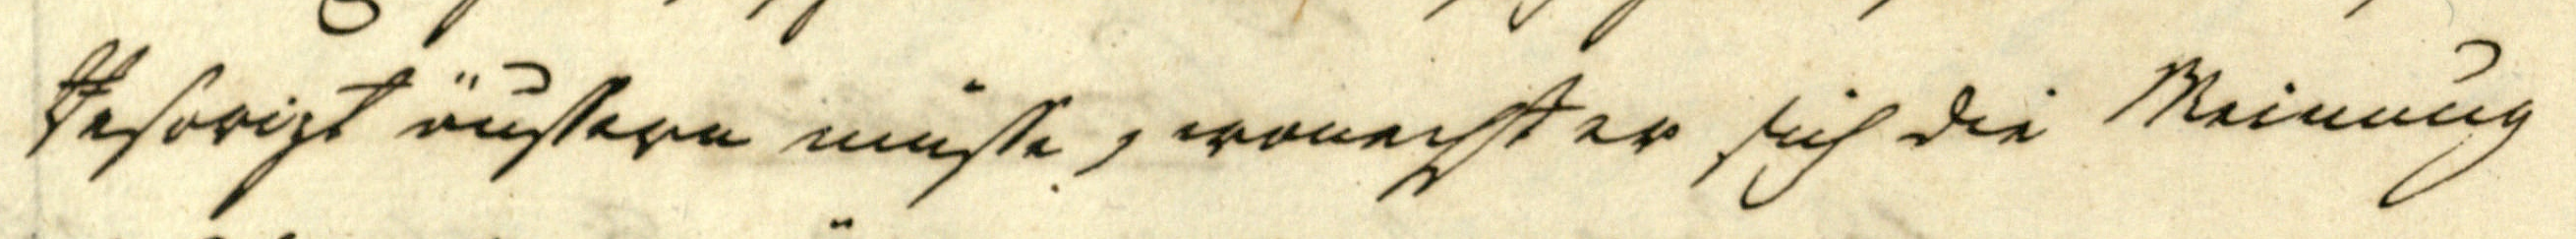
Rescript äussern müsse, wonechst er sich die Meinung
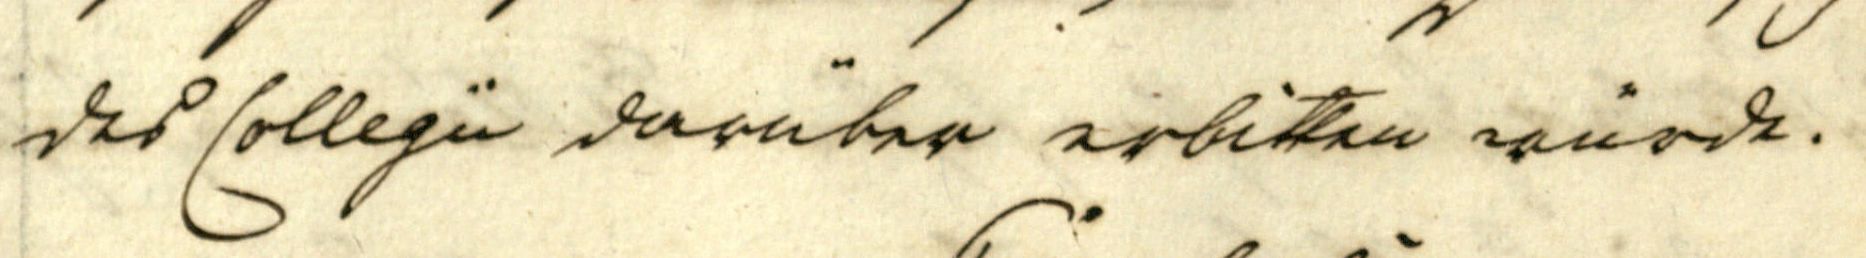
des Collegii darüber erbitten würde.
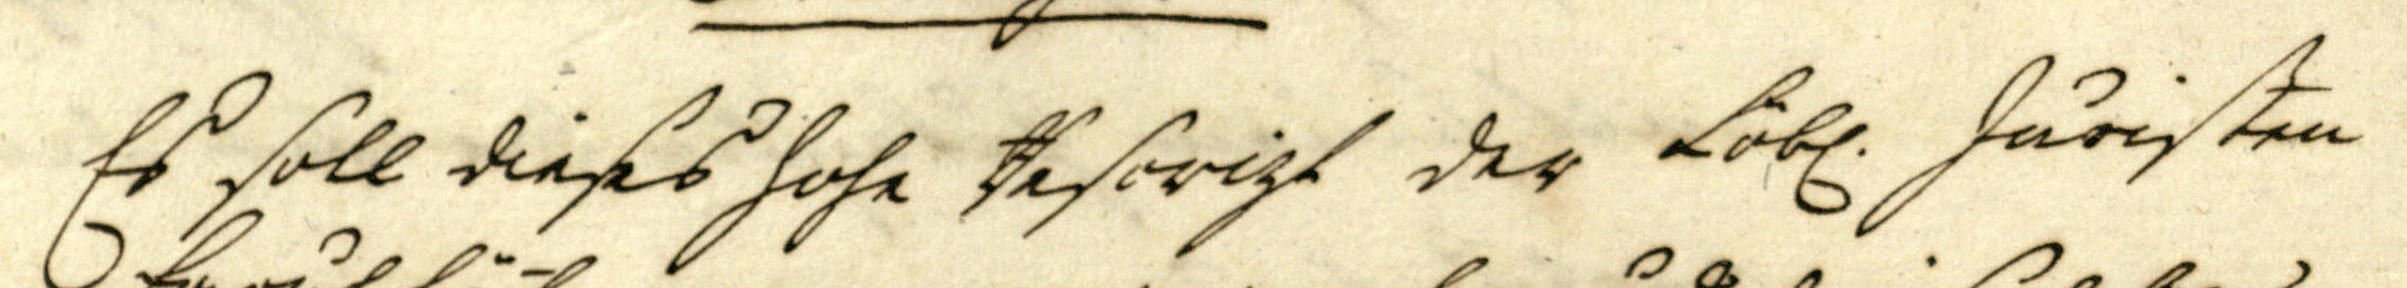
Es soll dieses hohe Rescript der Löbl. Juristen
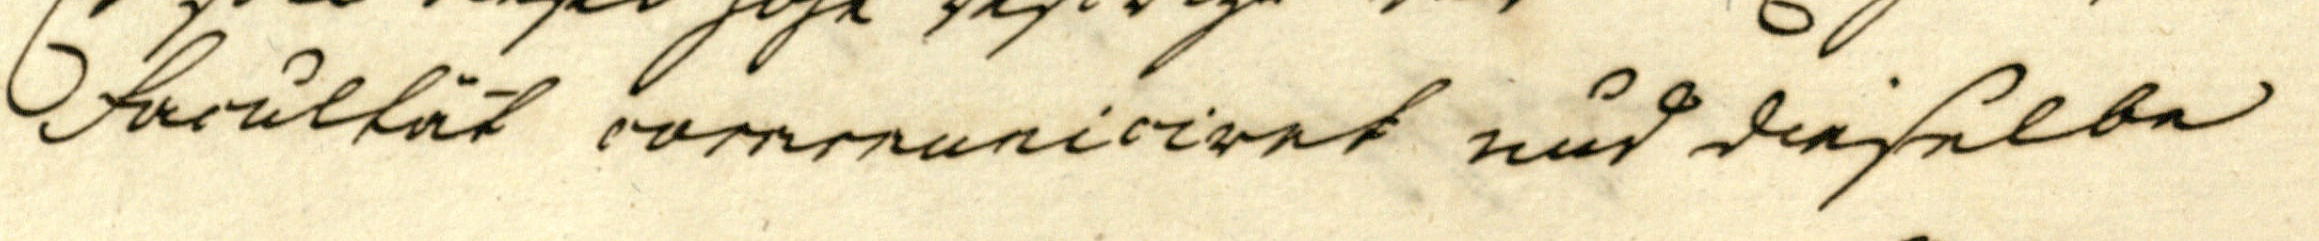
Facultät communiciret und dieselbe
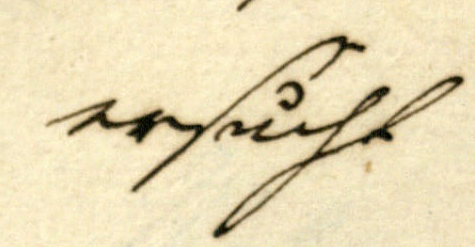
ersucht
